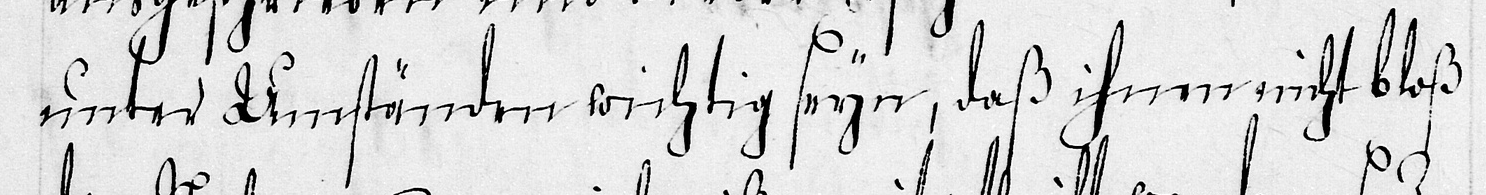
unter Umständen wichtig seyn, daß ihnen nicht bloß
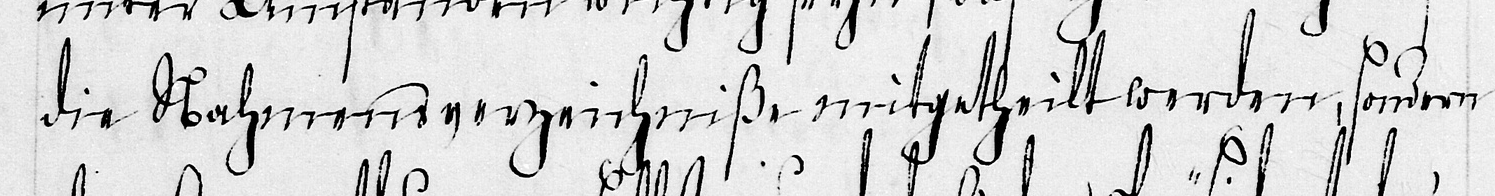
die Nahmensverzeichniße mitgetheilt werden, sondern
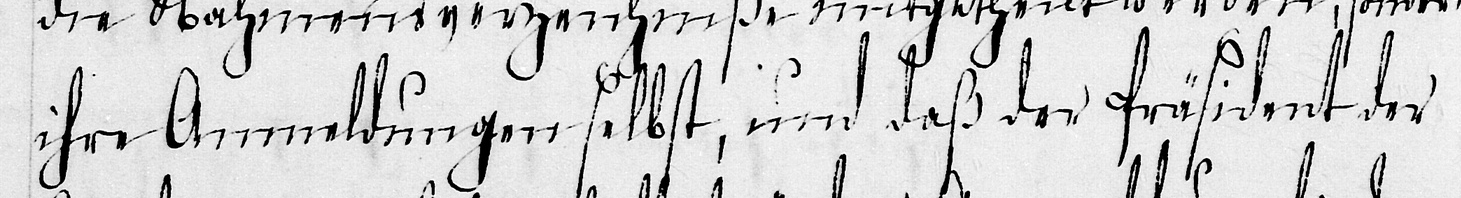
ihre Anmeldungen selbst, und daß der Präsident der
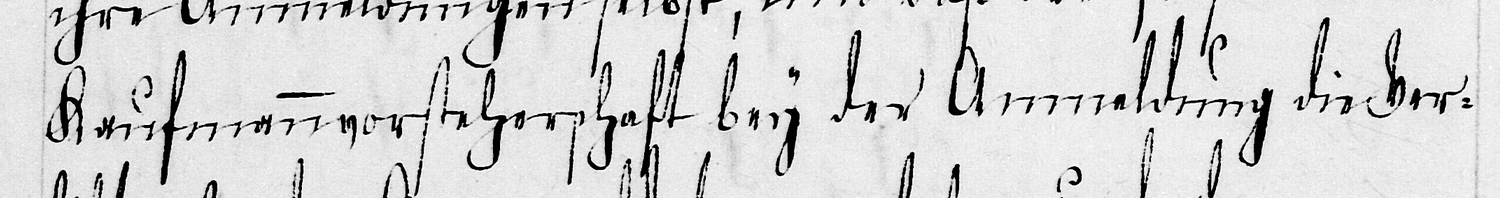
Kaufmannvorsteherschaft bey der Anmeldung die Ver¬
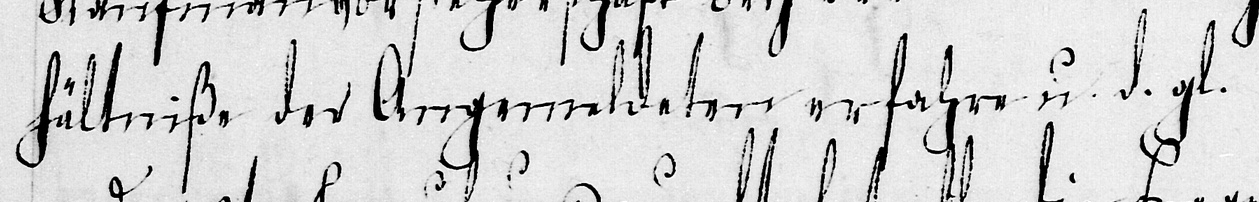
hältniße der Angemeldeten erfahre u. d. gl.
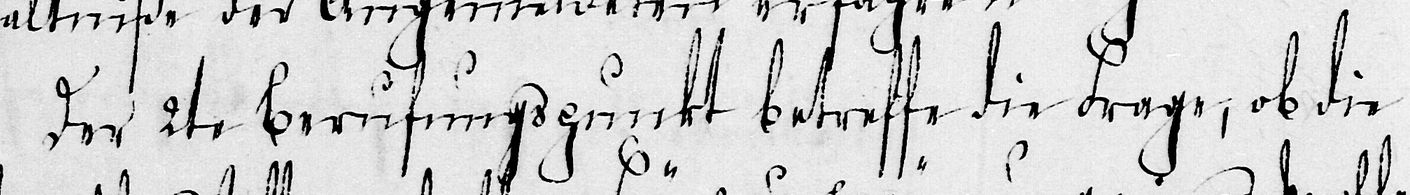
Der 2te Berufungspunkt betreffe die Frage, ob die
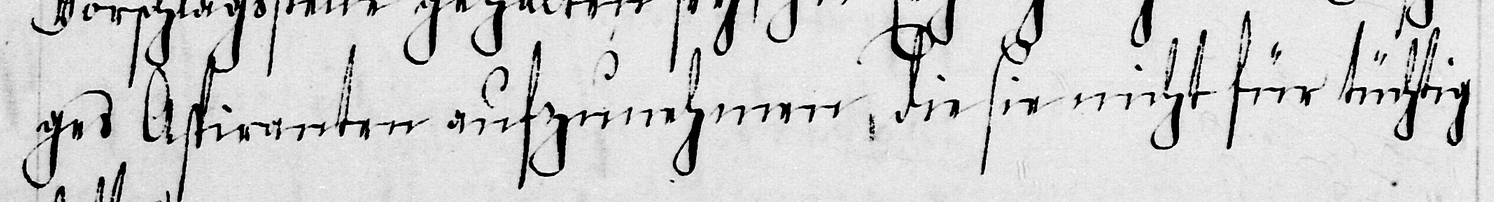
ges Aspiranten aufzunehmen, die sie nicht für tüchtig
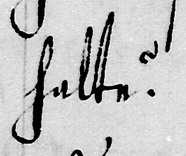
halte?
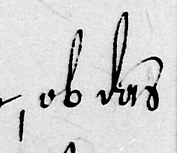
ob das
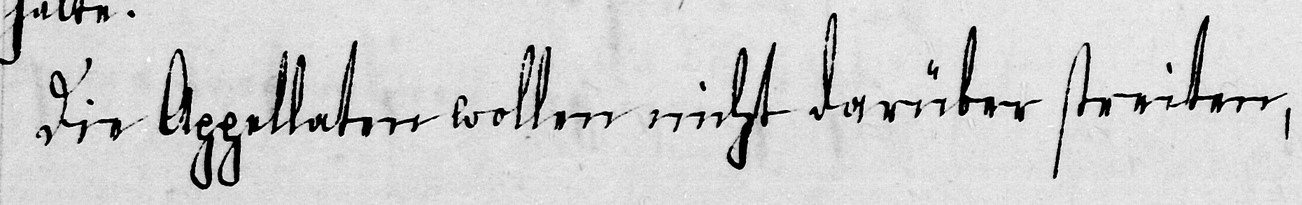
Die Appellaten wollen nicht darüber streiten,
